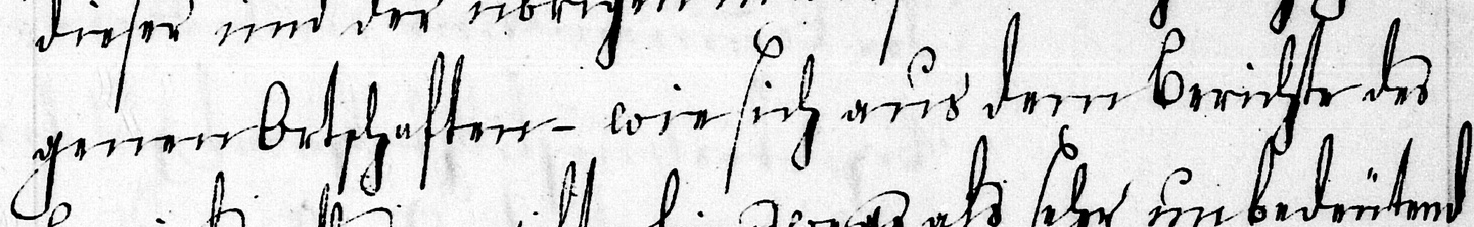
genen Ortschaften – wie sich aus dem Berichte des
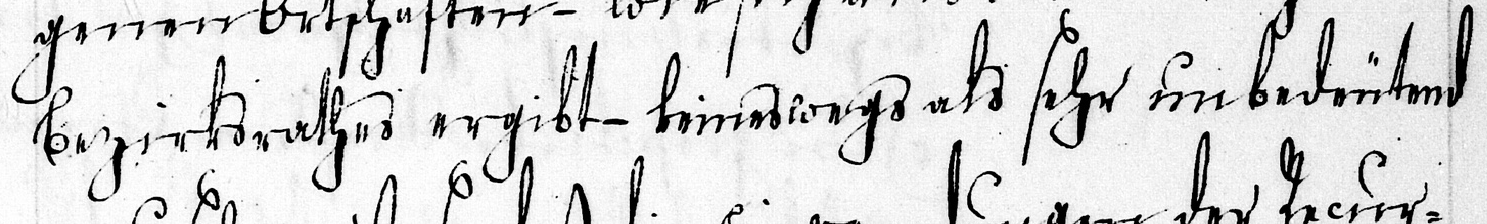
Bezirksrathes ergibt – keineswegs als sehr unbedeutend
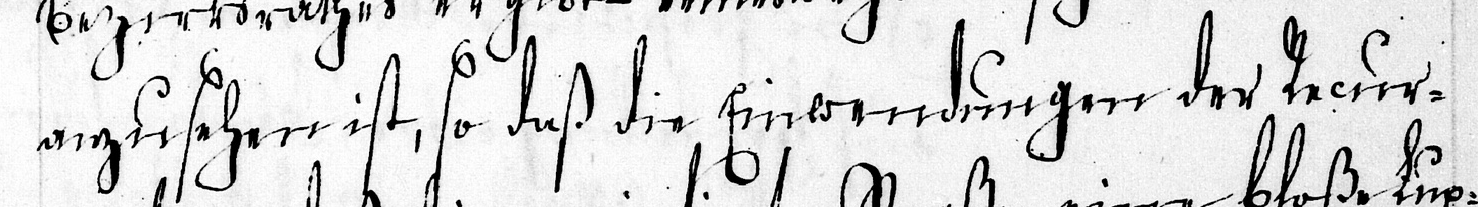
anzusehen ist, so daß die Einwendungen der Recur¬
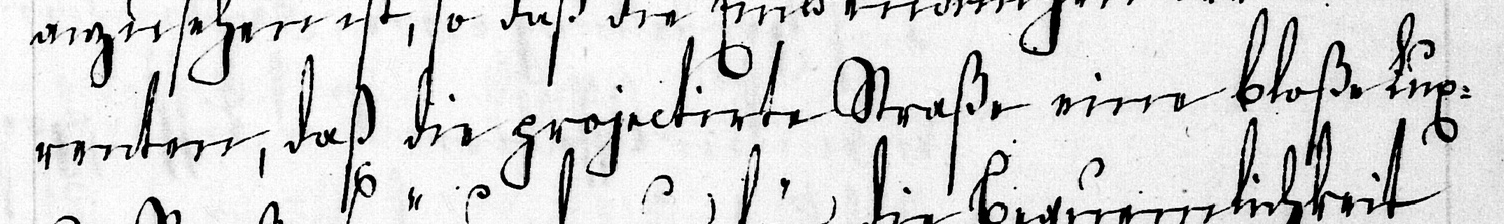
renten, daß die projectirte Straße eine bloße Lux¬
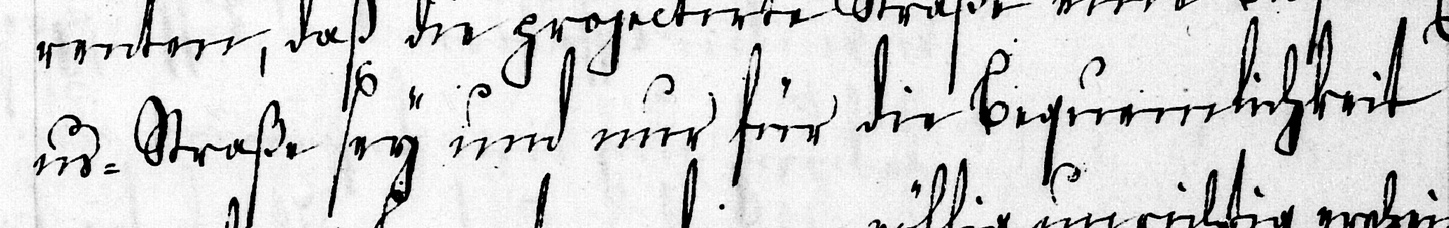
us-Straße sey und nur für die Bequemlichkeit
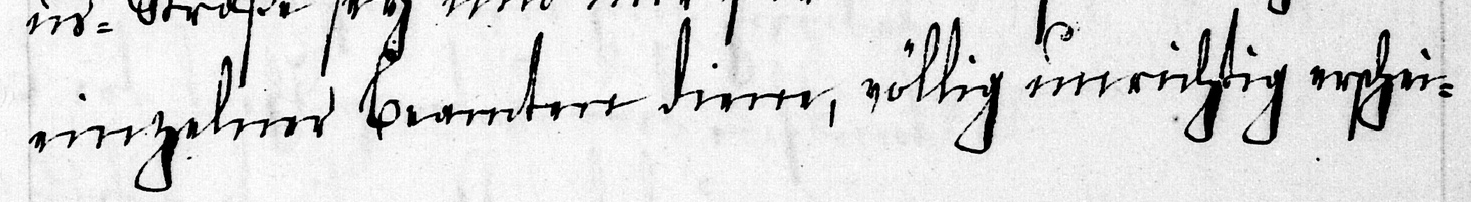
einzelner Beamten diene, völlig unrichtig erschei¬
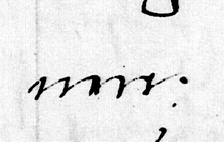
nen.
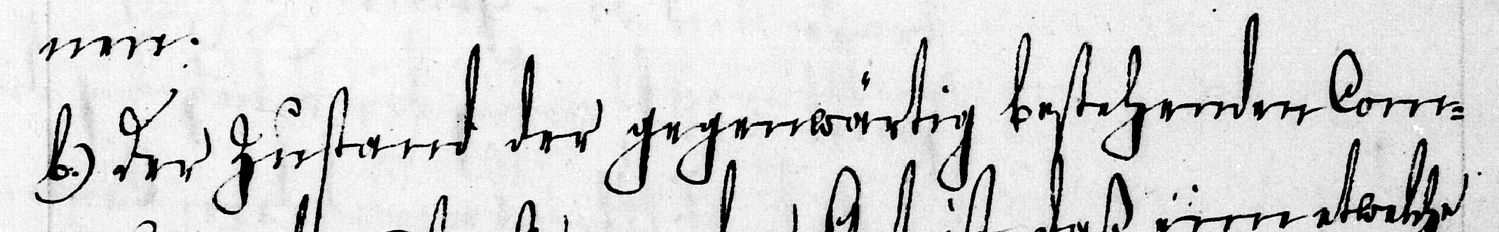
b.) Der Zustand der gegenwärtig bestehenden Com¬
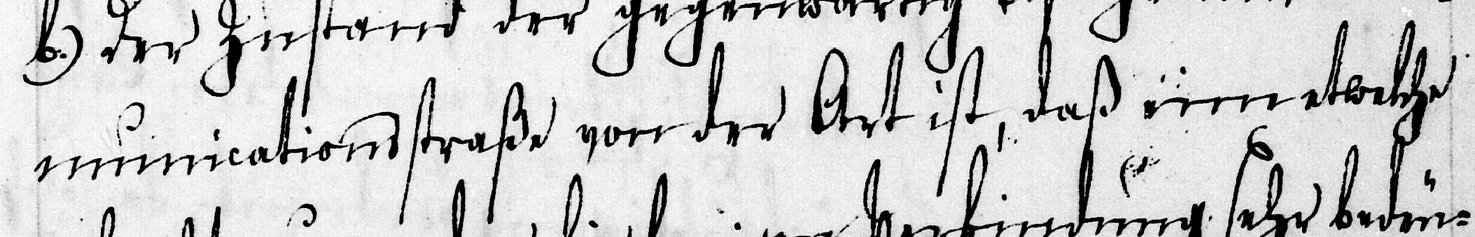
municationsstraße von der Art ist, daß eine etwelche
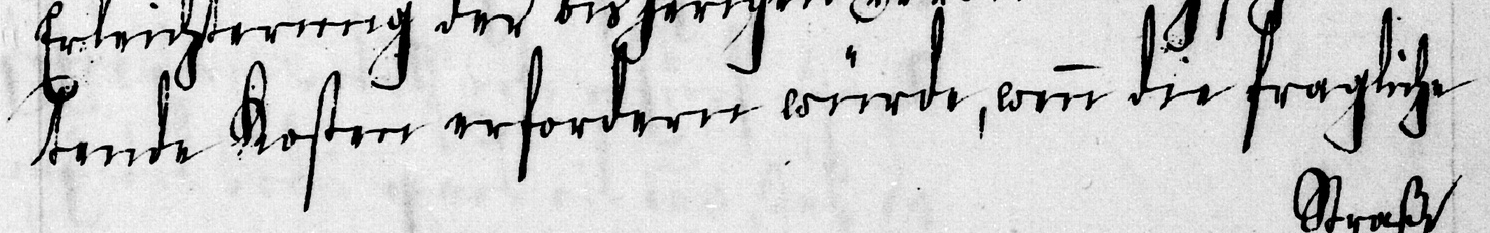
tende Kosten erfordern würde, wenn die fragliche
